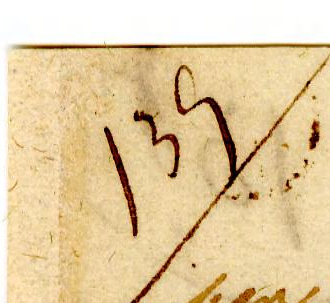139
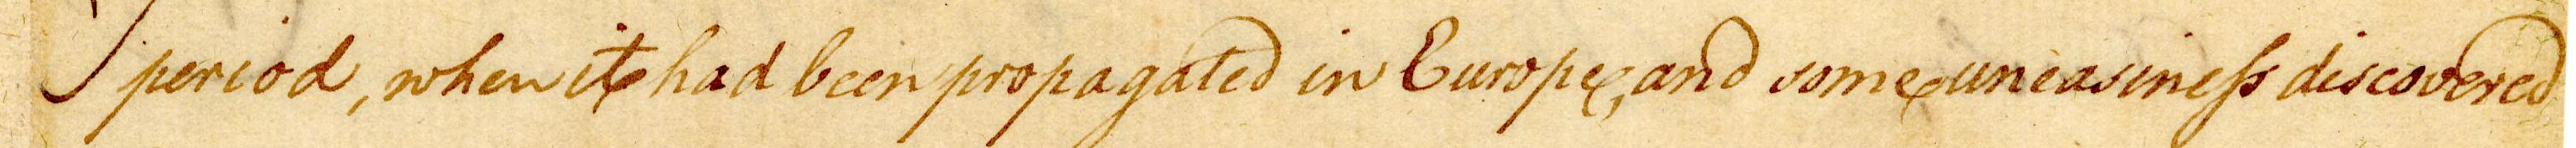period, when it had been propagated in Europe, and some uneasiness discovered
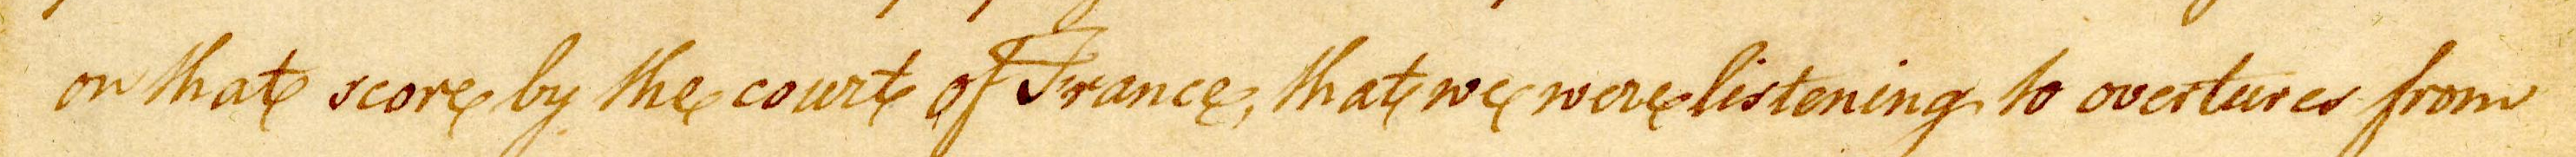on that score by the court of France, that we were listening to overtures from
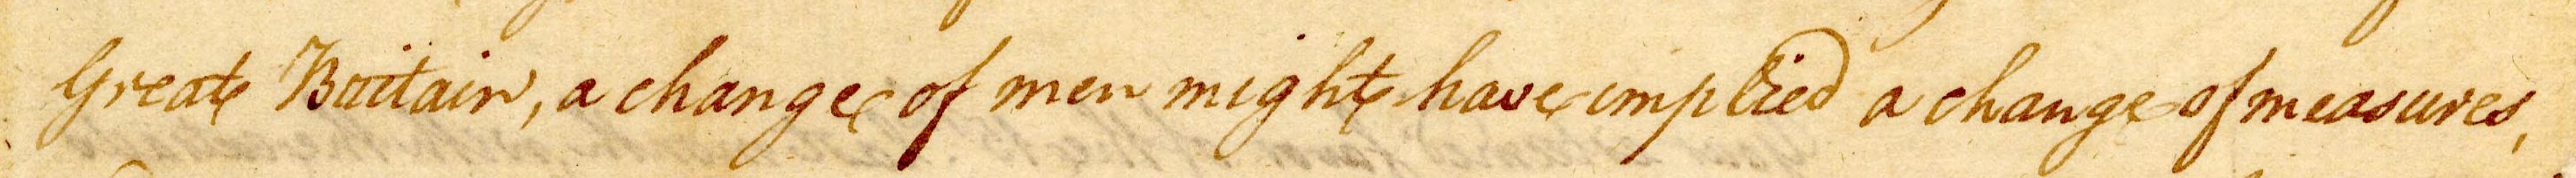Great Britain, a change of men might have implied a change of measures
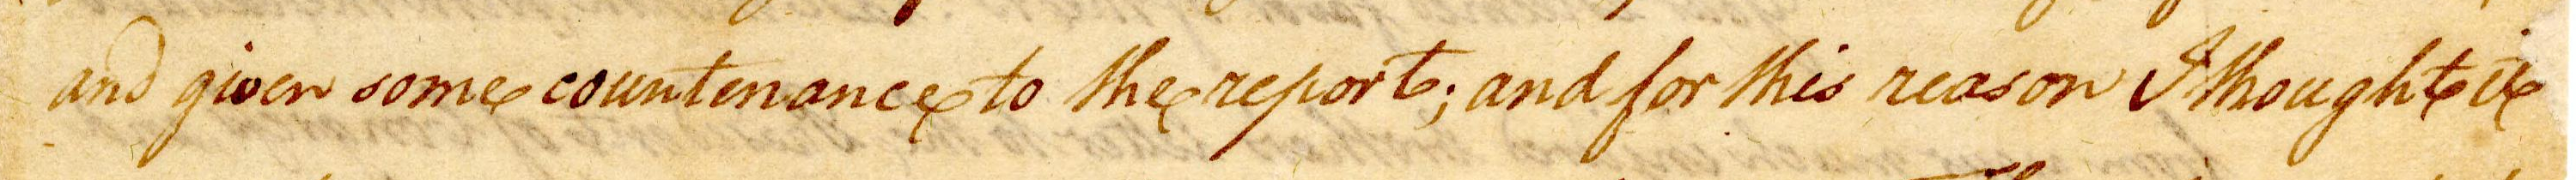and given some countenance to the report; and for this reason I thought if
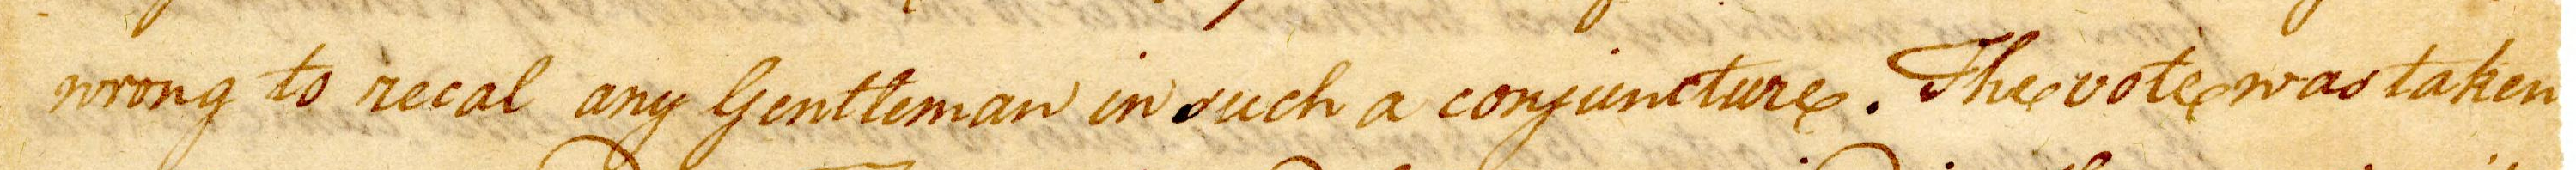wrong to recal any Gentleman in such a conjuncture. The vote was taken
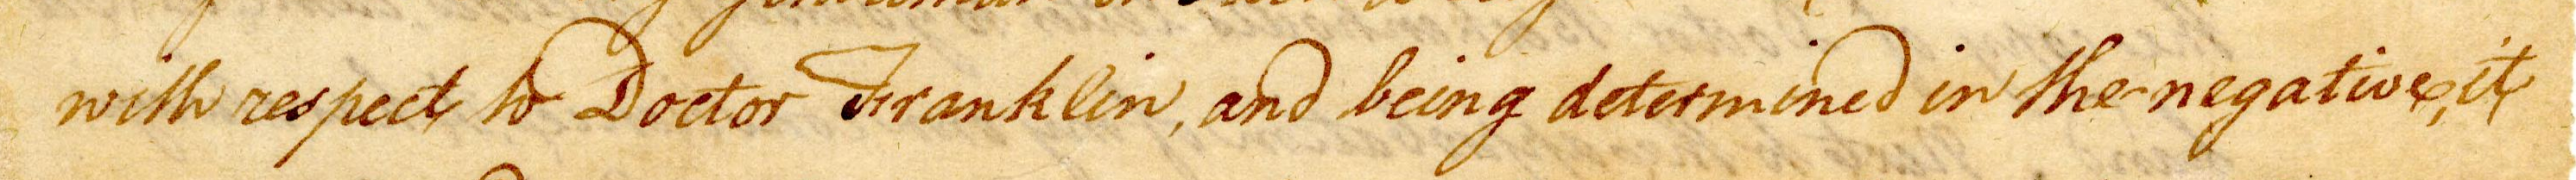with respect to Doctor Franklin, and being determined in the negative it
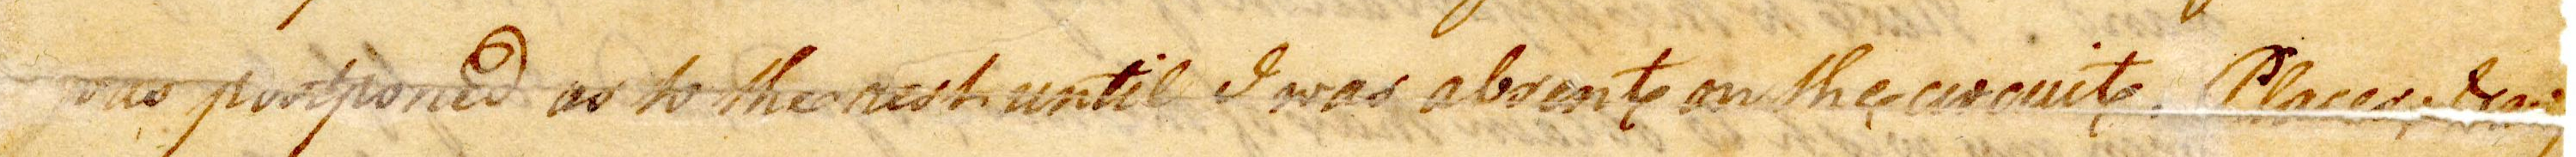was postponed as to the rest until I was absent in the court Places &c
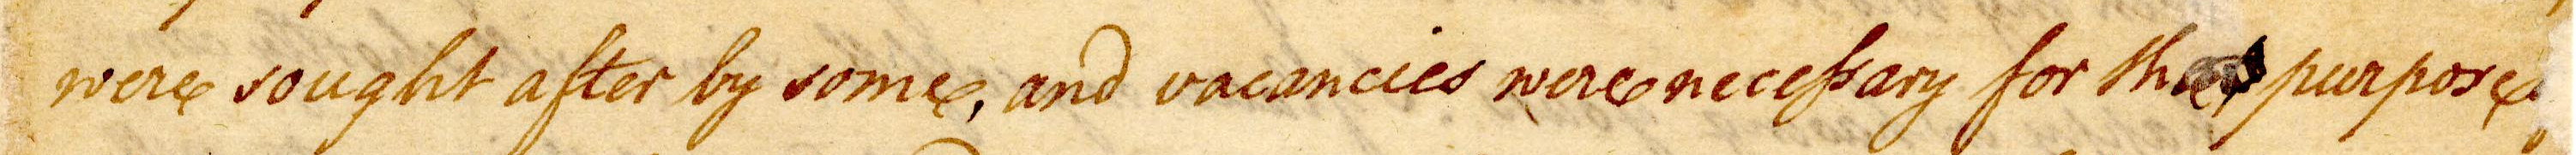were sought after by some, and vacancies were necessary for the purpose
